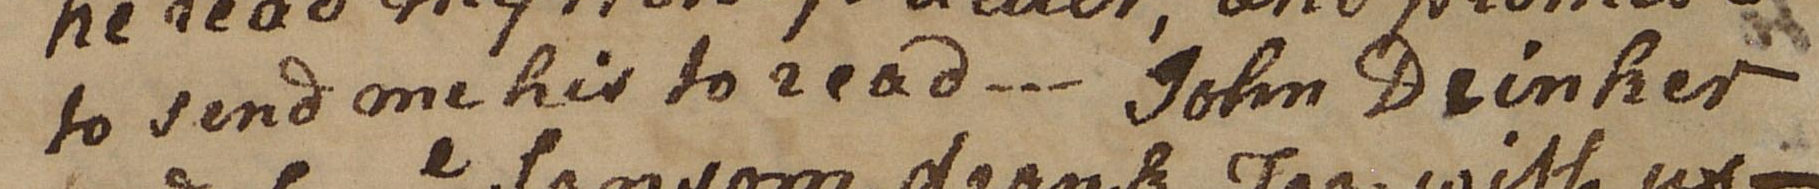to send me his to read-- John Drinker
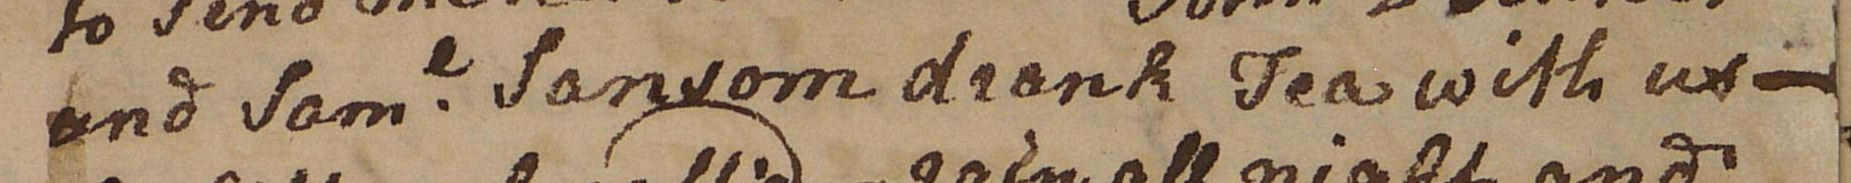and Sam^l. Sansom drank Tea with us-
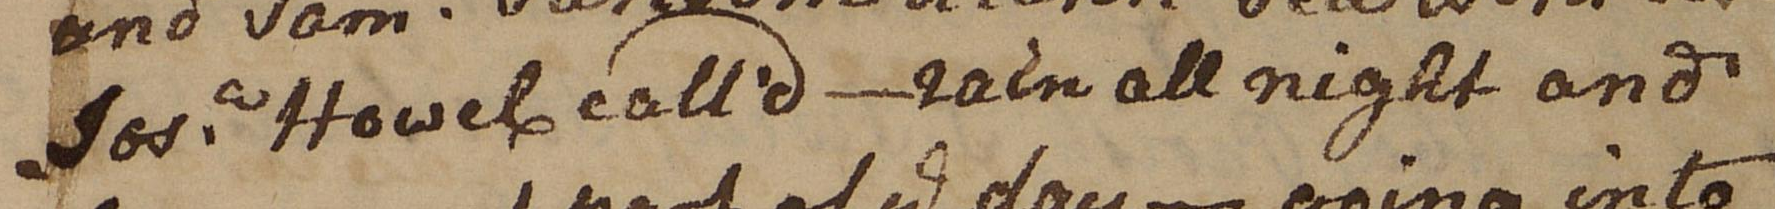Jos^a. Howel call'd- rain all night and
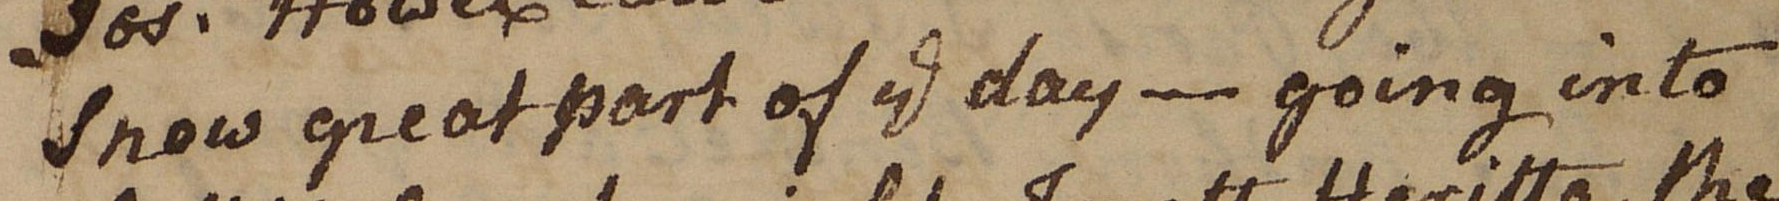Snow great part of y^e day- going into
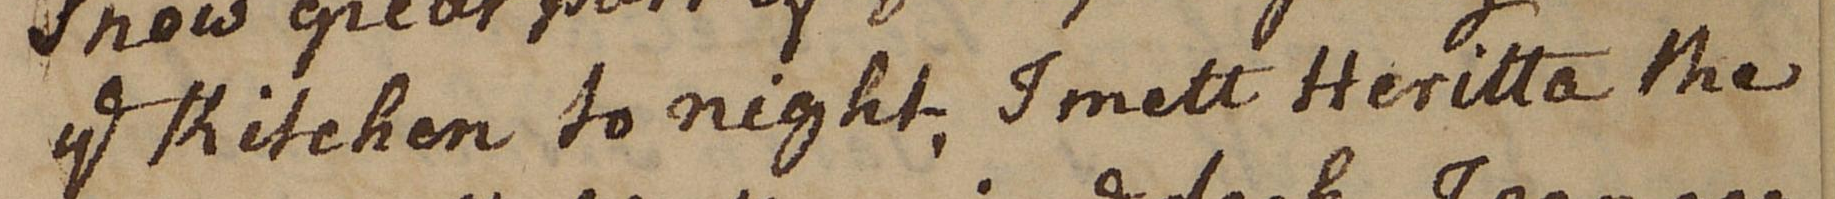y^e Kitchen to night, I mett Heritta the
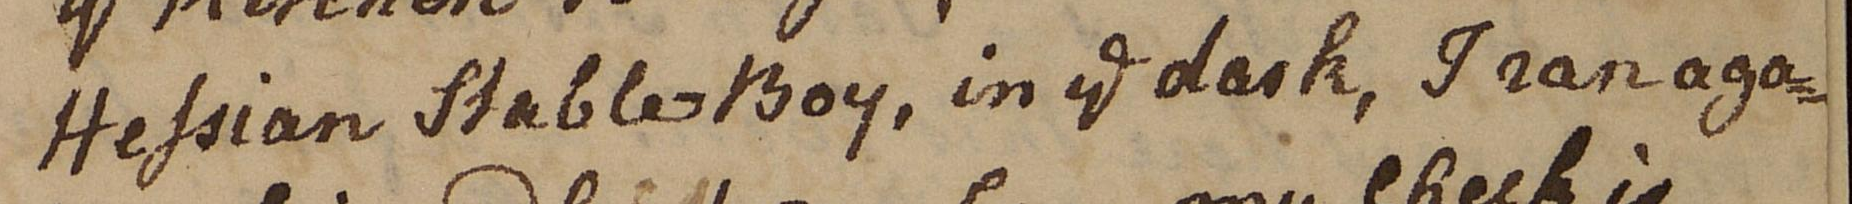Hessian Stable Boy, in y^e dark, I ran aga-
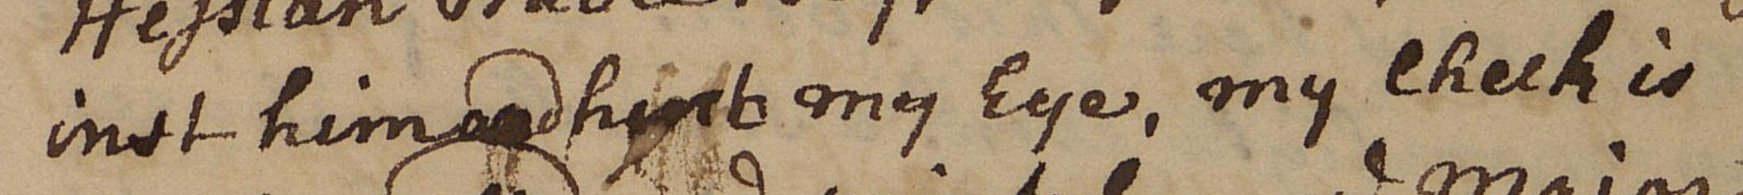inst him and hurt my Eye, my Cheek is
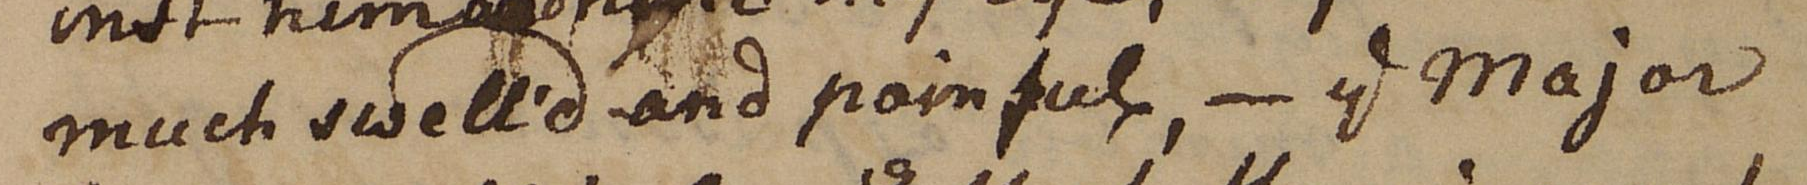much swell'd and painful,- y^e Major
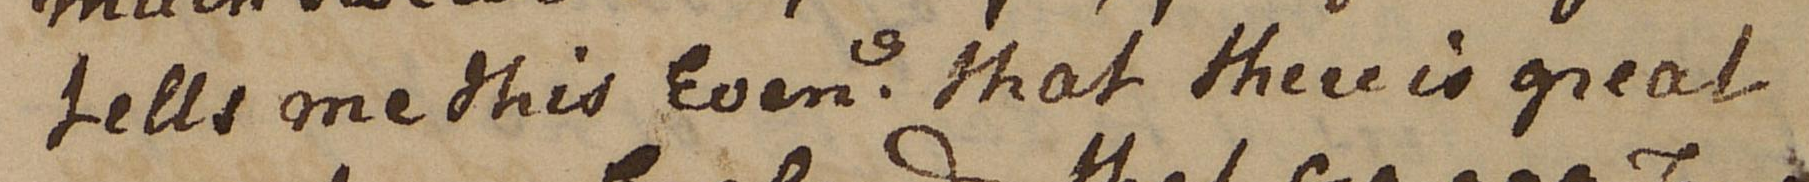tells me this Even^g. that there is great
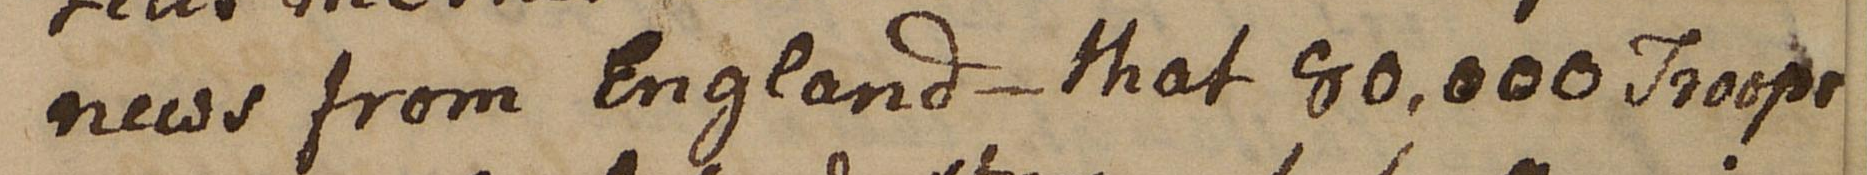news from England- that 80,000 Troops
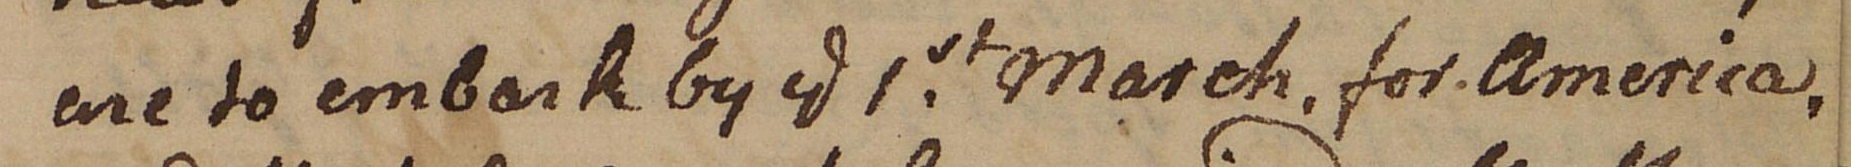are to embark by y^e 1^st. march, for America,
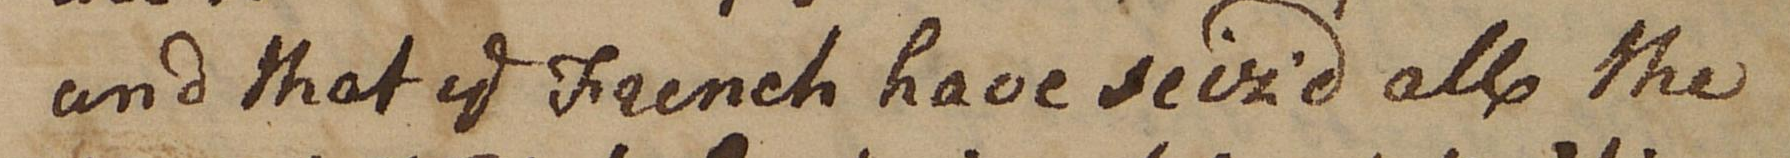and that y^e French have seiz'd all the
